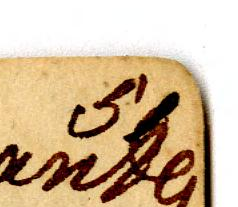51
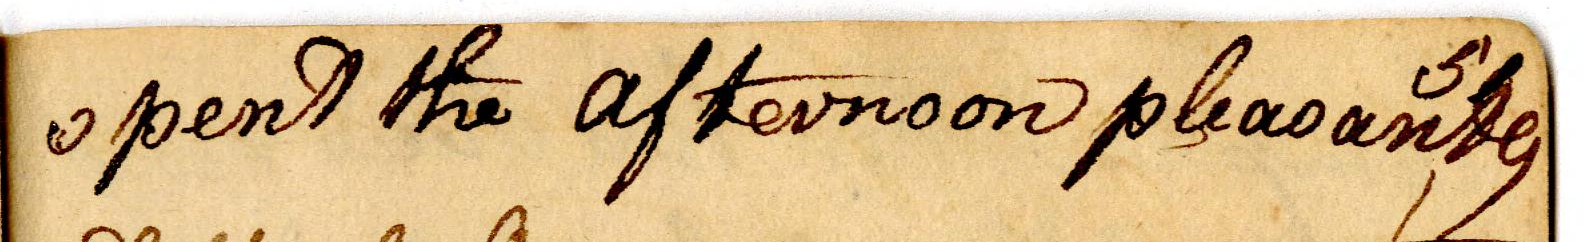spent the afternoon pleasantly
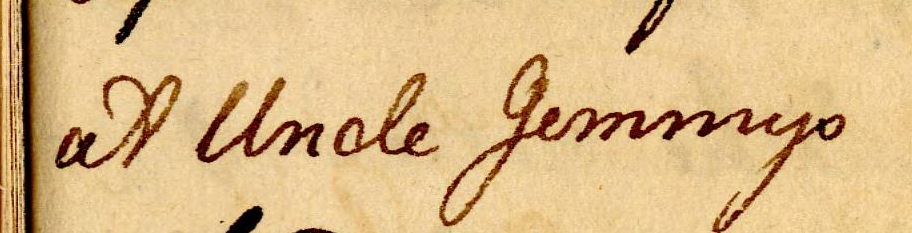at Uncle Jemmys
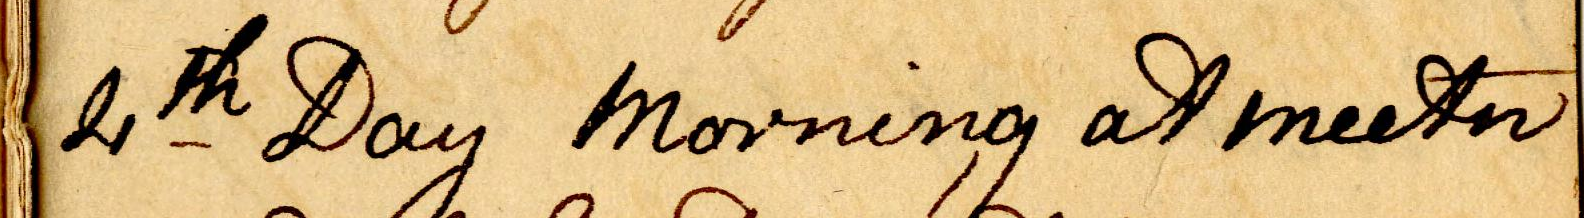4^th Day morning at meetn
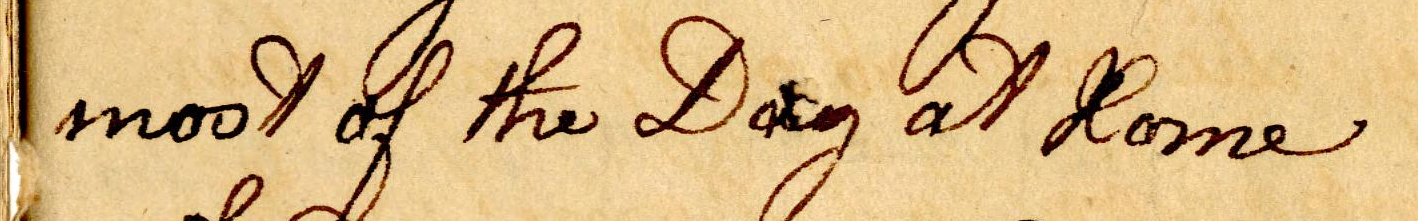most a the Day at Home
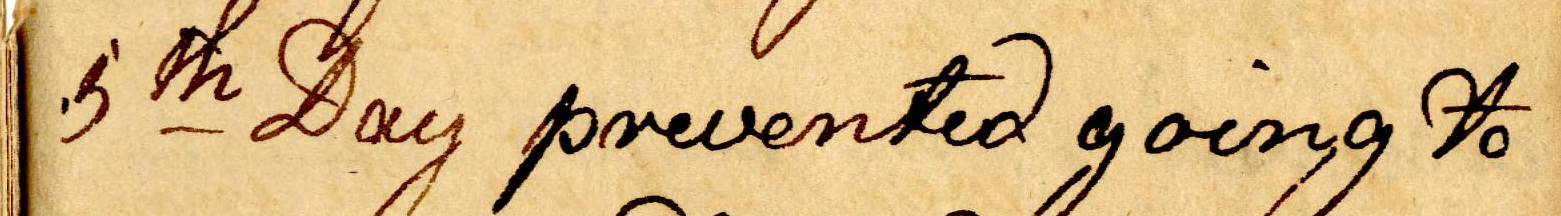5^th Day prevented going to
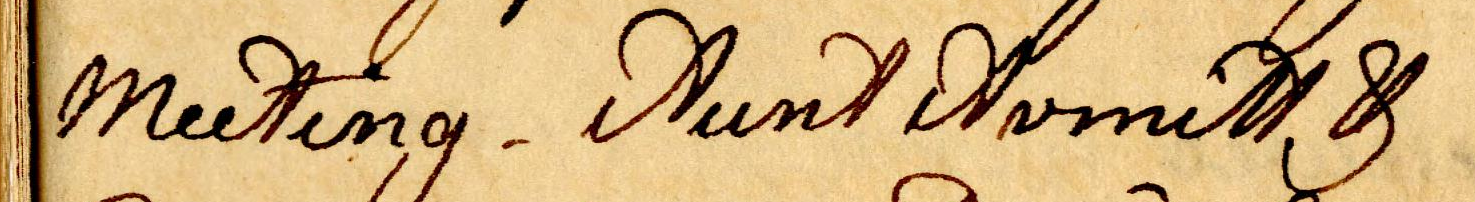Meeting- Aunt Armitt &
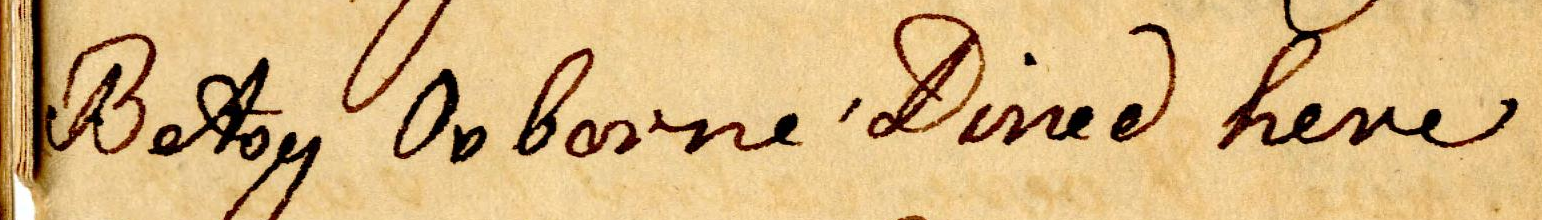Betsy Osborne Dined here
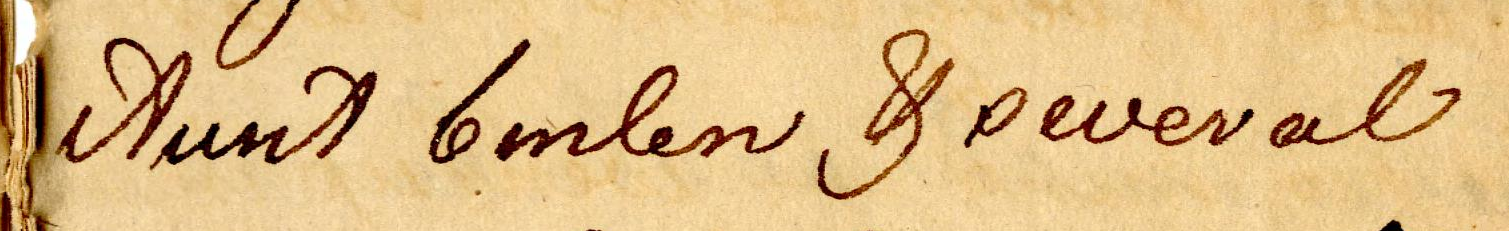Aunt Emlen & several
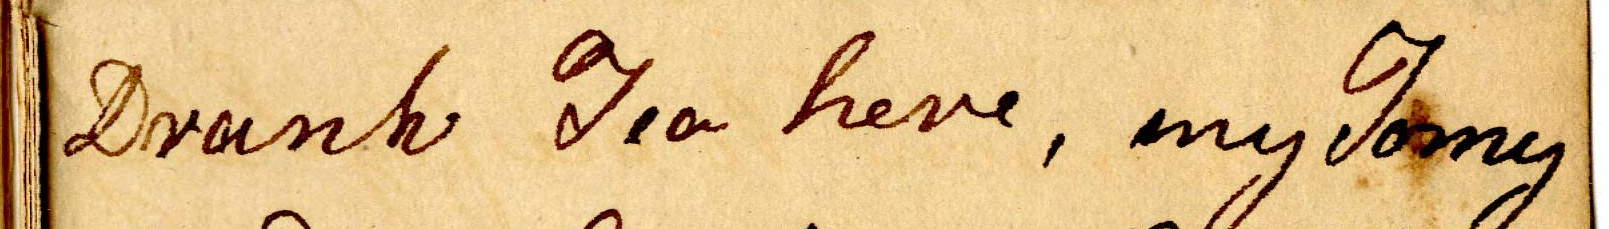Drank Tea here, my Tomy
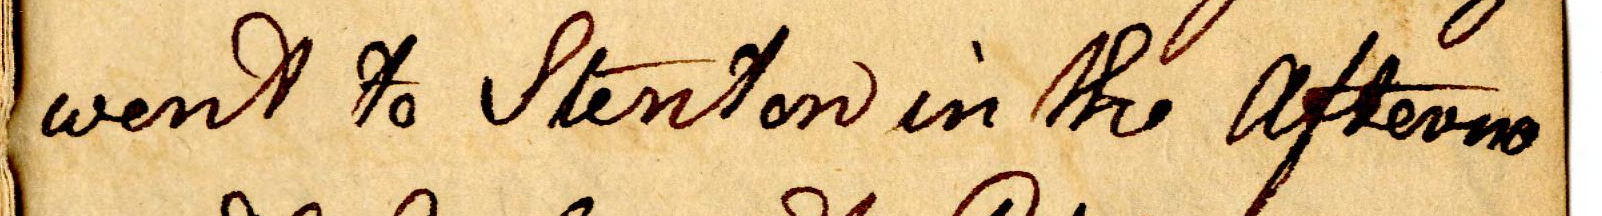went to Stenton in the Afterno
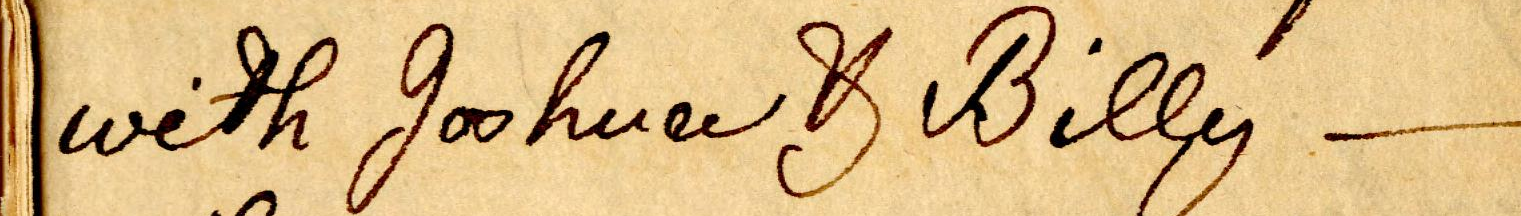with Joshua & Billy-
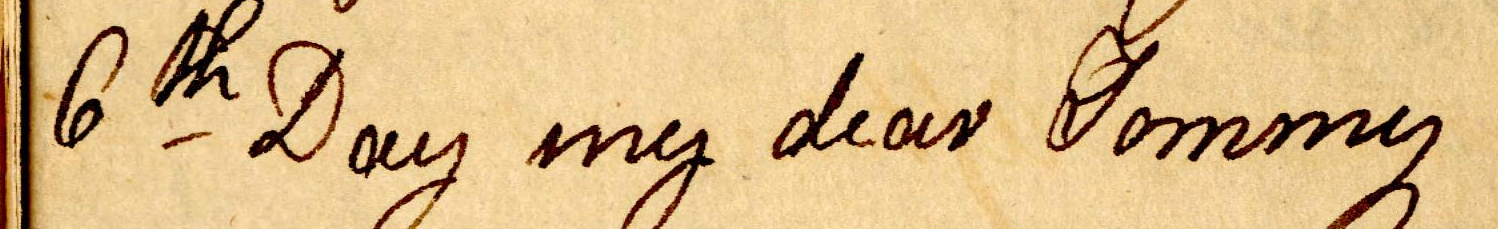6^th Day my dear Tommy
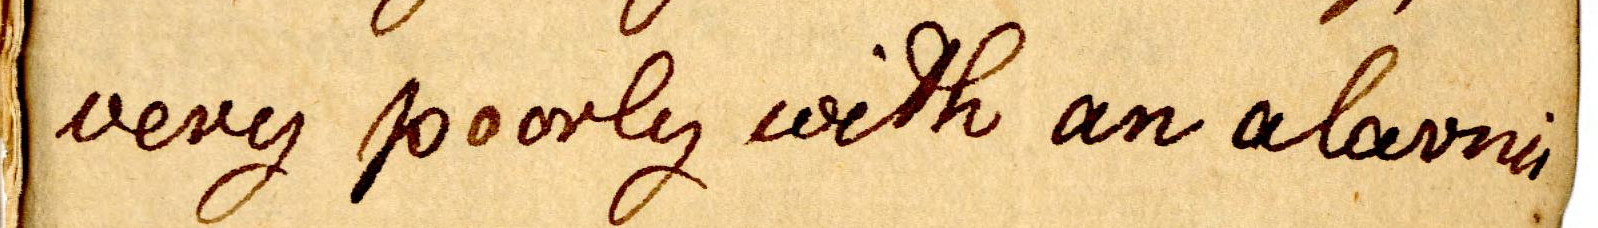very poorly with an alarni
